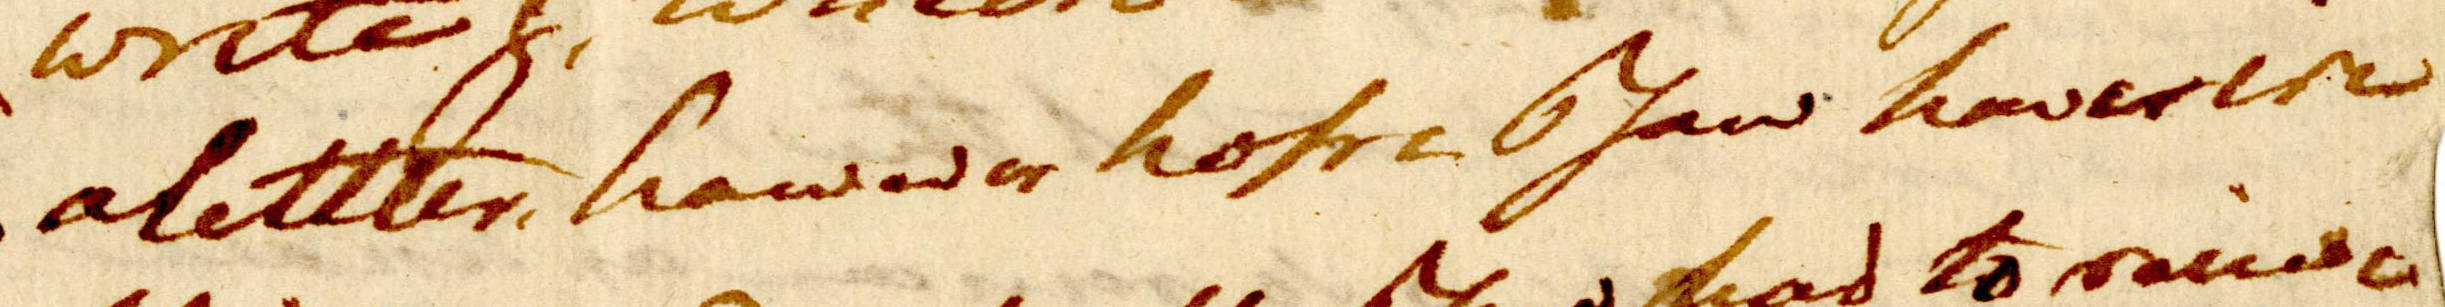a letter however hope you have rire
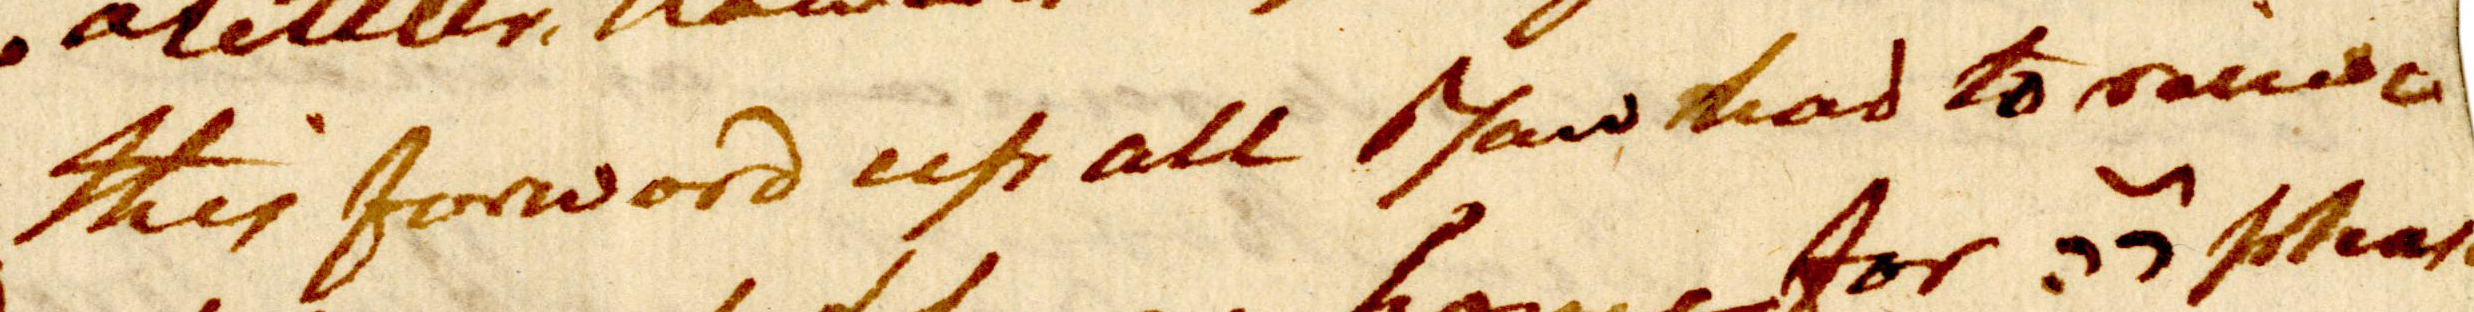this forword up all you had to raise
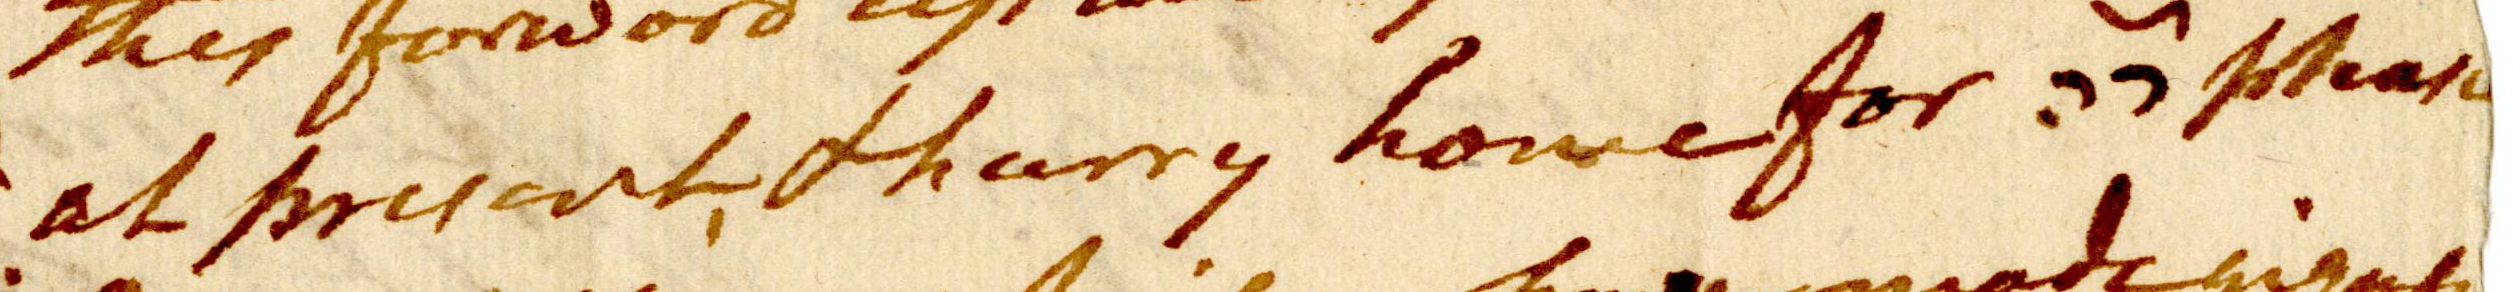at present & hurry home for [__] please
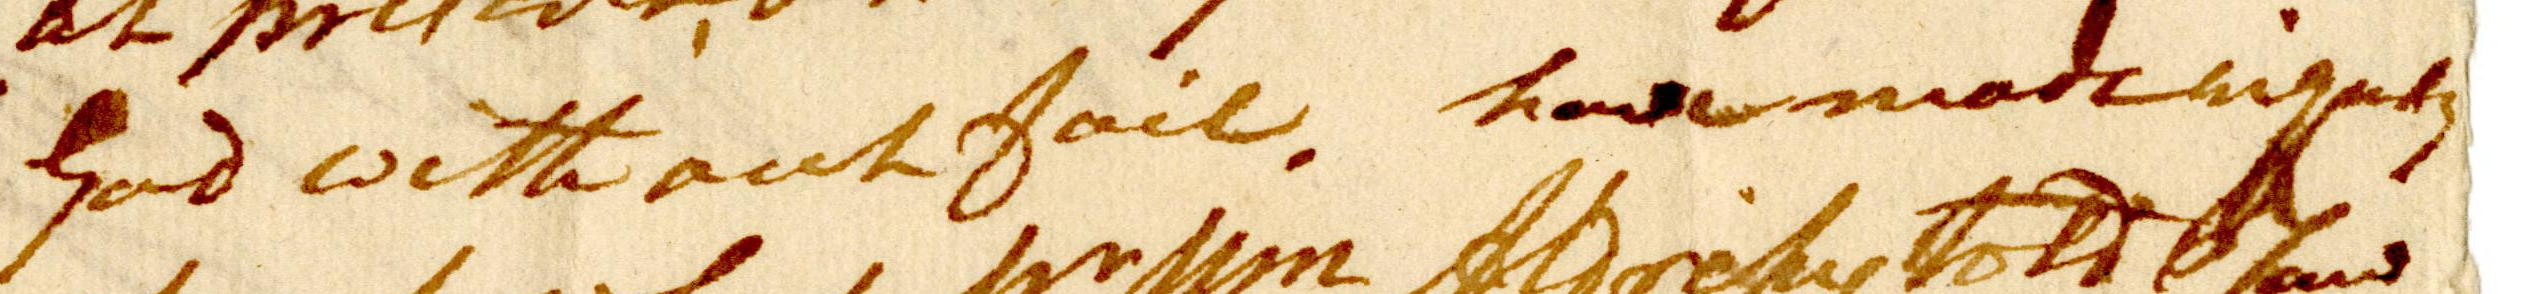God with out fail, have made inquiry
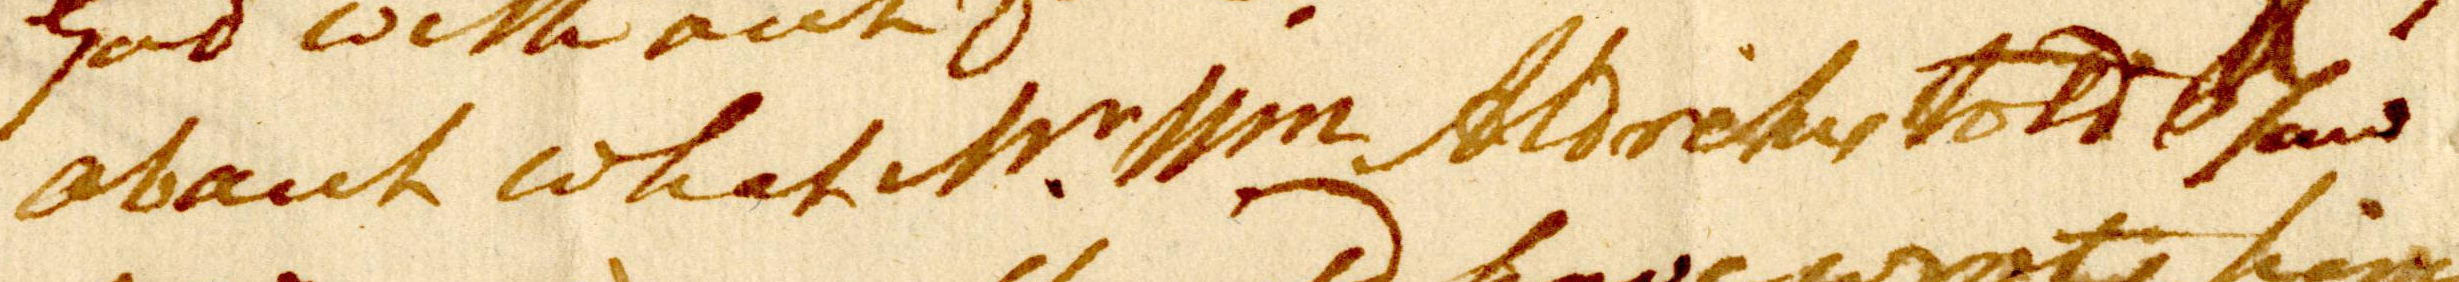about what M^r W^m Aldricks told you
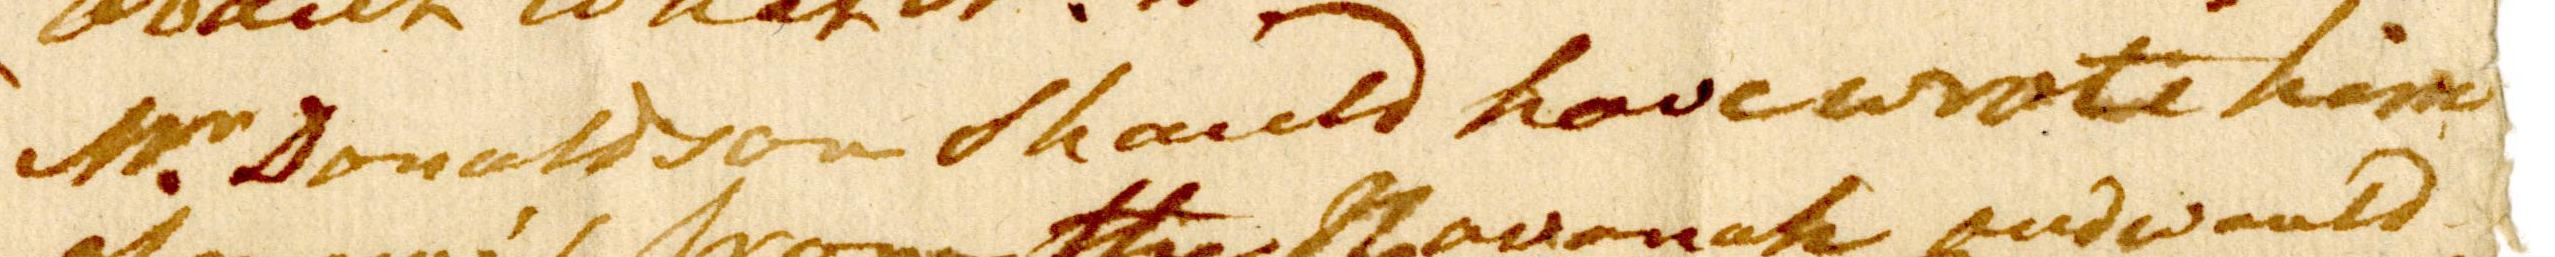M^r Donaldson Should have wrote him
